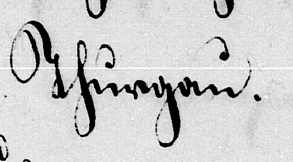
Thurgau.
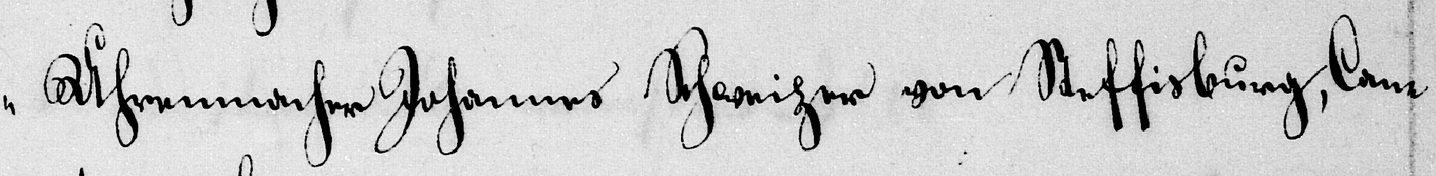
Uhrenmacher Johannes Schweizer von Steffisburg, Can¬
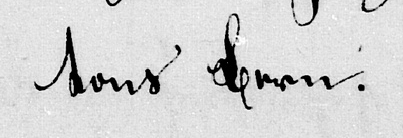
tons Bern.
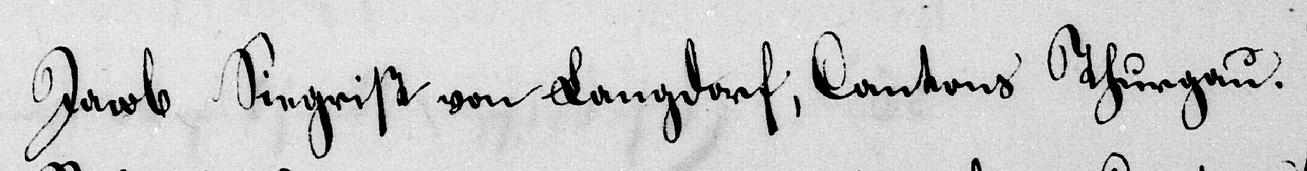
Jacob Siegrist von Langdorf, Cantons Thurgau.
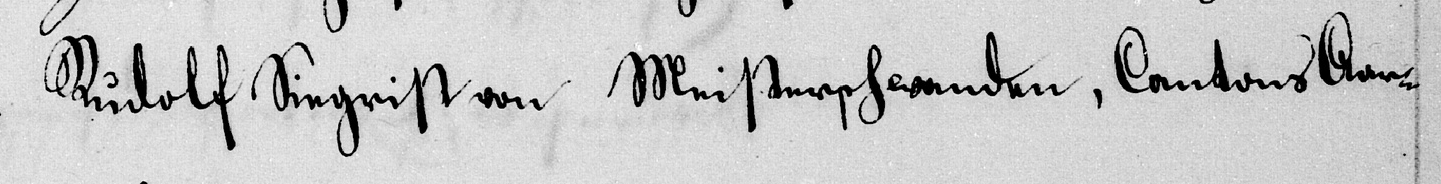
Rudolf Siegrist von Meisterschwanden, Cantons Aar¬
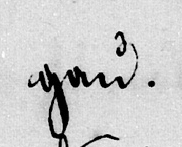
gau.
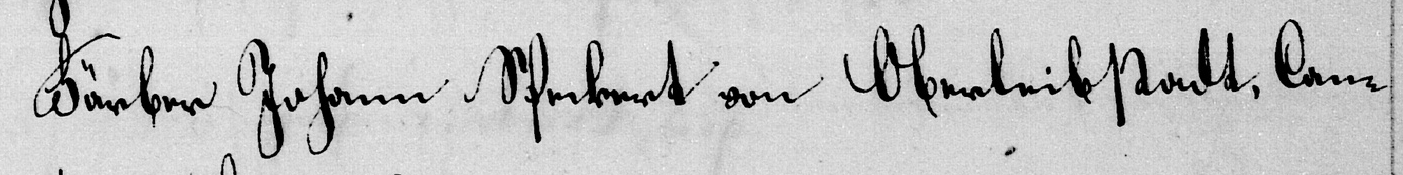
Färber Johann Speckert von Oberleibstadt, Can¬
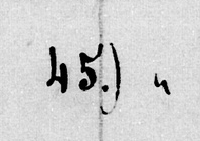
45.) “
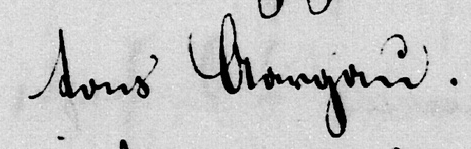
tons Aargau.
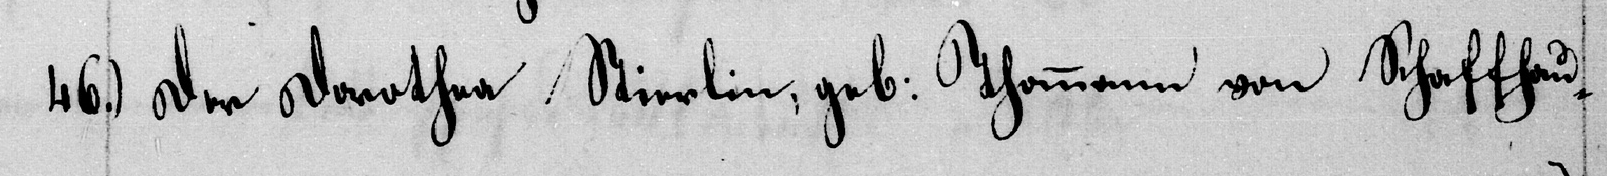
46.) Der Dorothea Stierlin, geb: Thommenn von Schaffhau¬
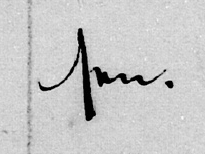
sen.
